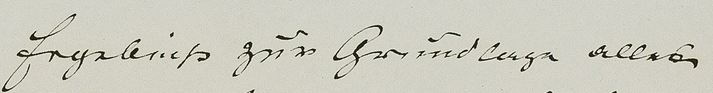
Ergebniß zur Grundlage alles
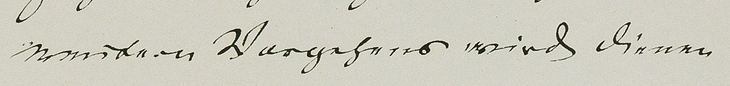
weitern Vorgehens wird dienen
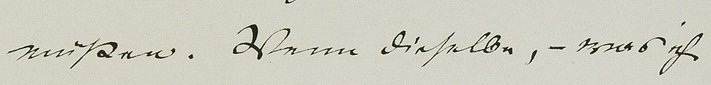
müßen. Wenn dieselbe, – was ich
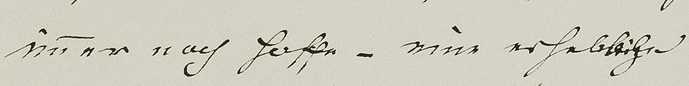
immer noch hoffe – eine erhebliche
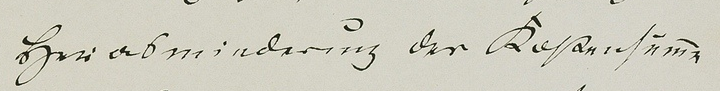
Herabminderung der Kostensumme
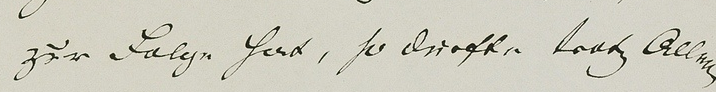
zur Folge hat, so dürfte trotz Allem
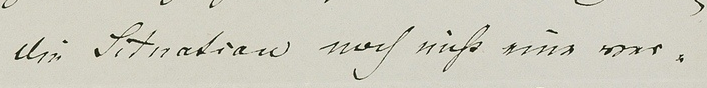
die Situation noch nicht eine ver-
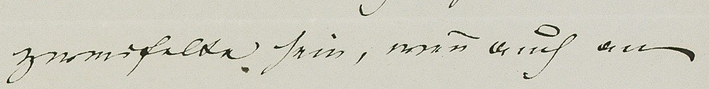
zweifelte sein, wenn auch an
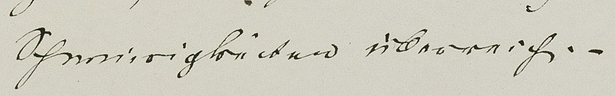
Schwierigkeiten überreich. –
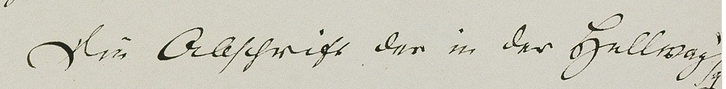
Die Abschrift der in der Hellwag'schen
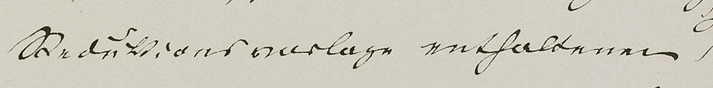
Reduktionsvorlage enthaltenen
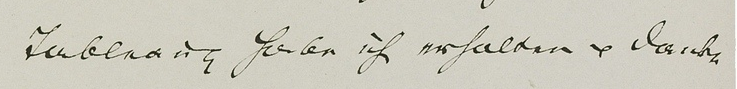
Tableaux habe ich erhalten & danke
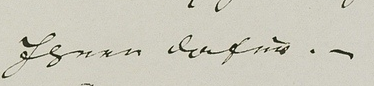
Ihnen dafür. –
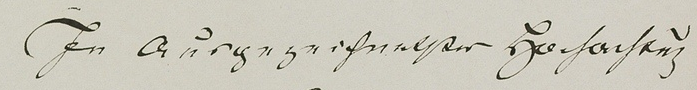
In ausgezeichneter Hochachtung
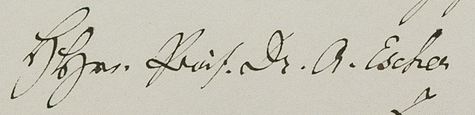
HHrn Präs. Dr. A. Escher
